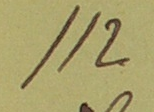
112
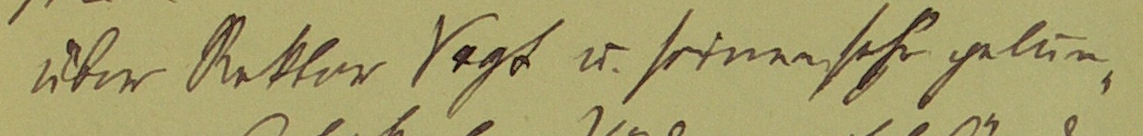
über Rektor Vogt u. seinen sehr gelun¬
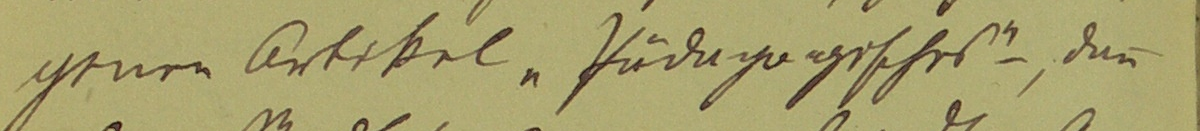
genen Artikel „Pädagogisches“ -, dan
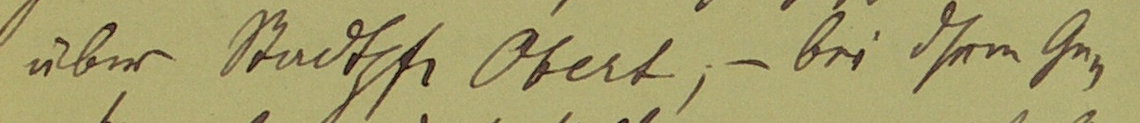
über Stadtpf. Obert; - bei diesem Ge¬
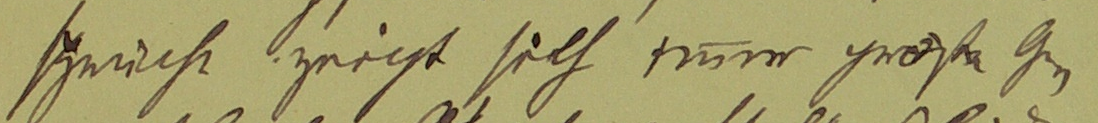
spräch zeigt sich imer große Ge¬
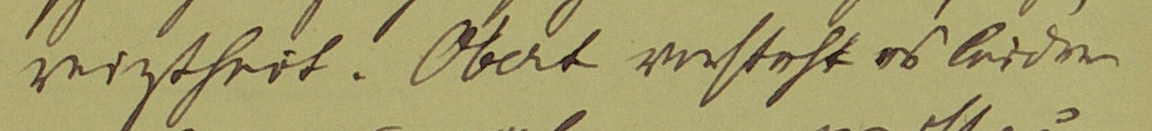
reiztheit. Obert versteht es leider
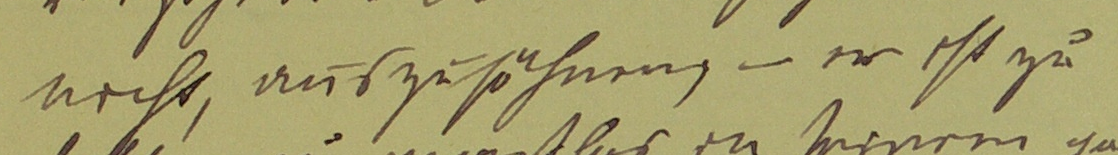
nicht, auszusöhnen, - er ist zu
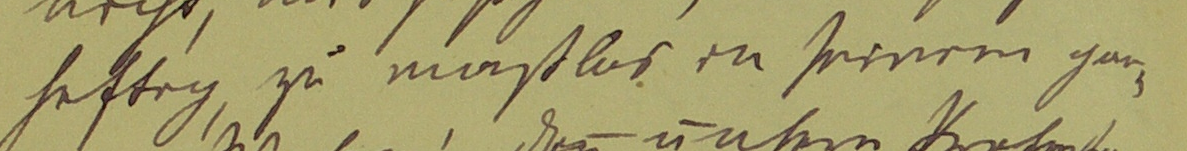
heftig, zu maßlos in seinem gan¬
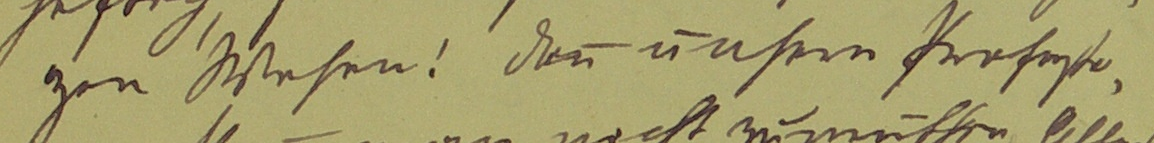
zen Wesen! Den unseren Professo¬
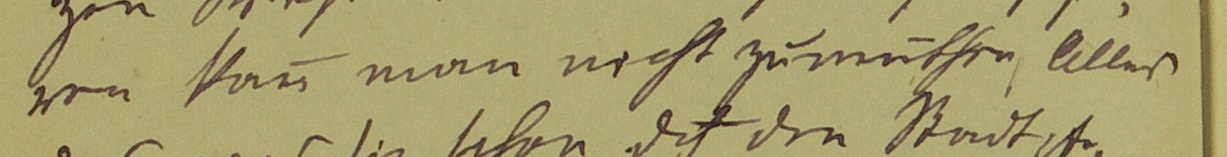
ren kann man nicht zumuthen, alles
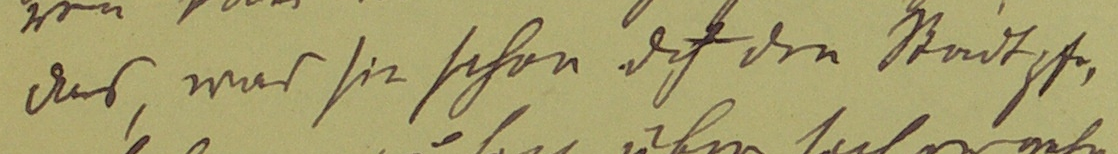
das, was sie schon drh den Stadtpfr.
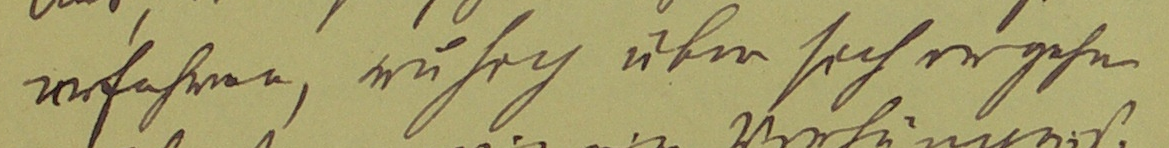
erfahren, ruhig über sich ergehen
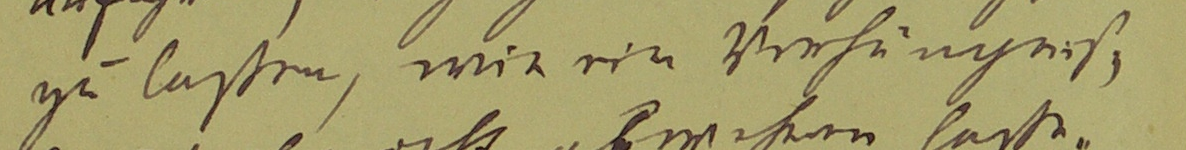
zu lassen, wie ein ? Verhängnis,
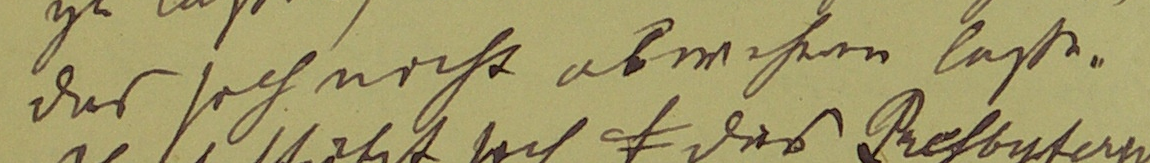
das sich nicht abwehren laße.
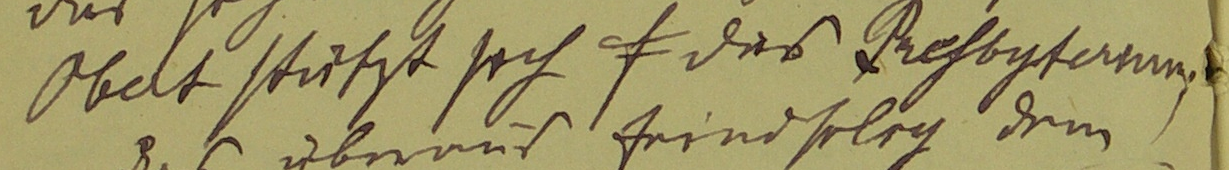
Obert stützt sich f das Presbyterium,
